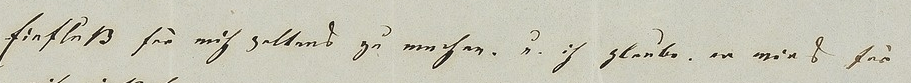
Einfluß für mich geltend zu machen, u. ich glaube, er wird für
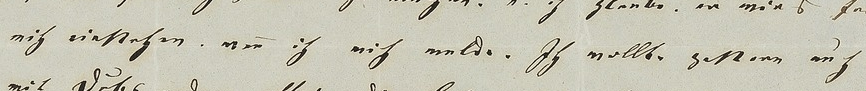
mich einstehen, wenn ich mich melde. Ich wollte gestern auch
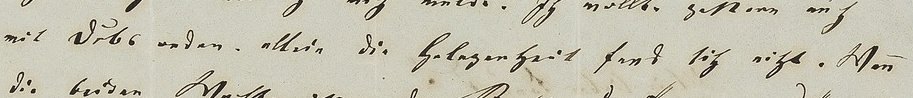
mit Dubs reden, allein die Gelegenheit fand sich nicht. Wenn
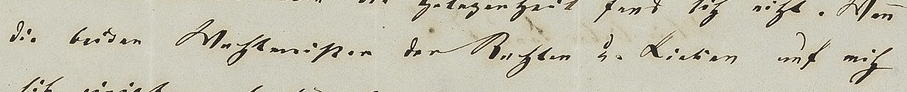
die beiden Wachtmeister der Rechten u. Linken auf mich
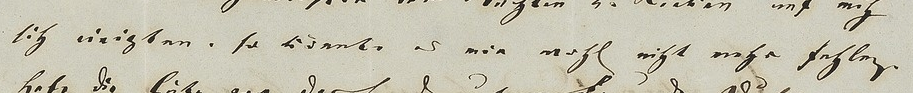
sich einigten, so könnte es mir wohl nicht mehr fehlen.
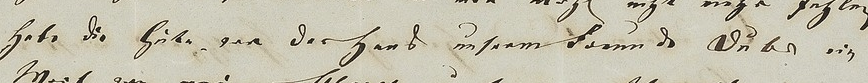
Habe die Güte, vor der Hand unserm Freunde Dubs ein
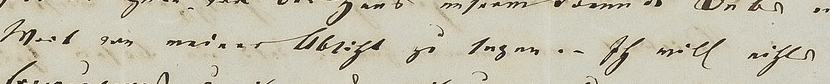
Wort von meiner Absicht zu sagen. – Ich will nichts
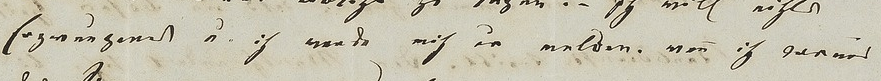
Erzwungenes u. ich werde mich nur melden, wenn ich voraus
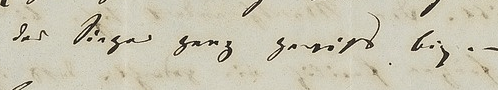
des Sieges ganz gewiß bin. –
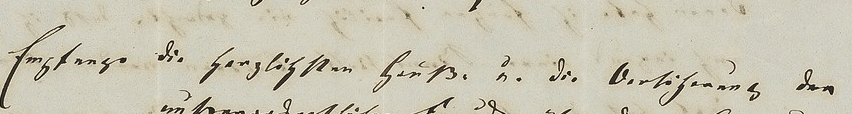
Empfange die herzlichsten Grüße u. die Versicherung der
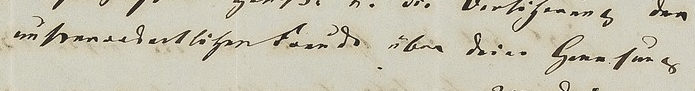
außerordentlichen Freude über deine Genesung
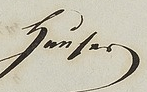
Hauser
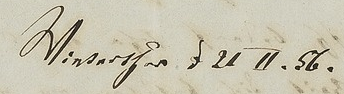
Winterthur d 21 II. 56.
